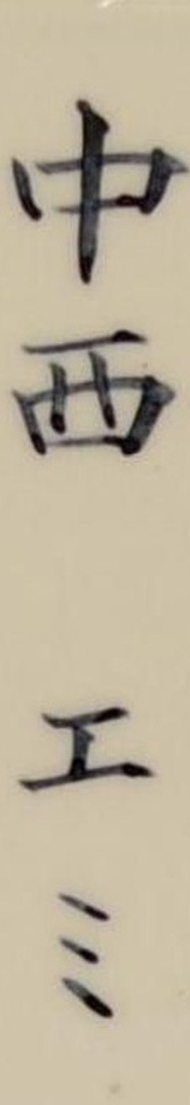中西エミ
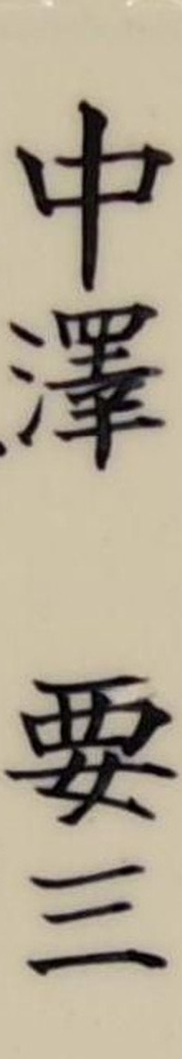中澤要三
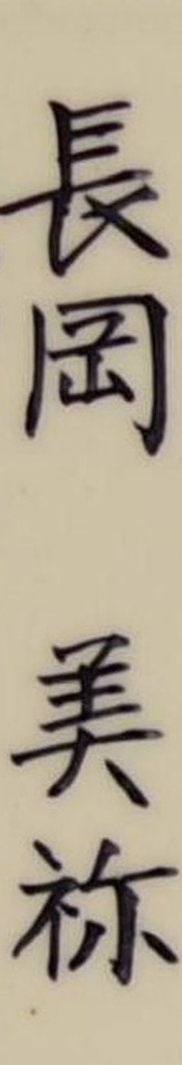長岡美称
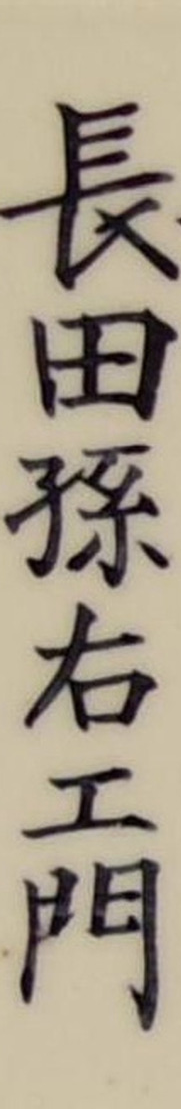長田孫右エ門
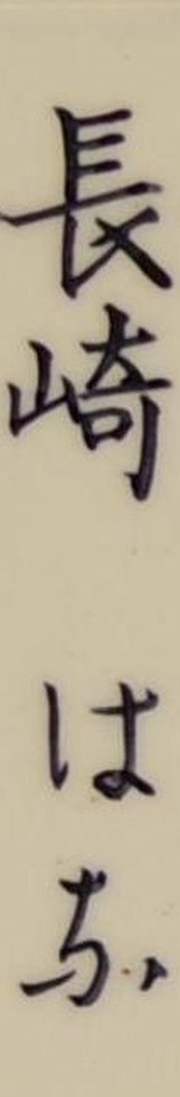長崎はな
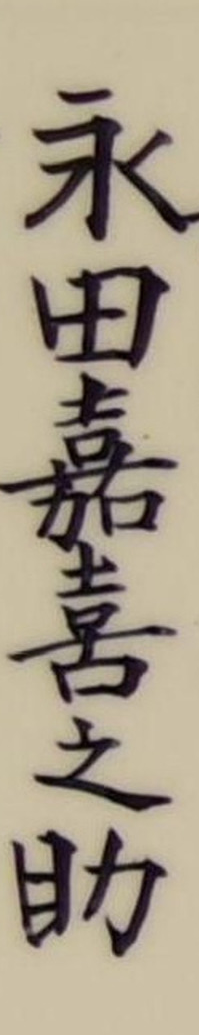永田嘉喜之助
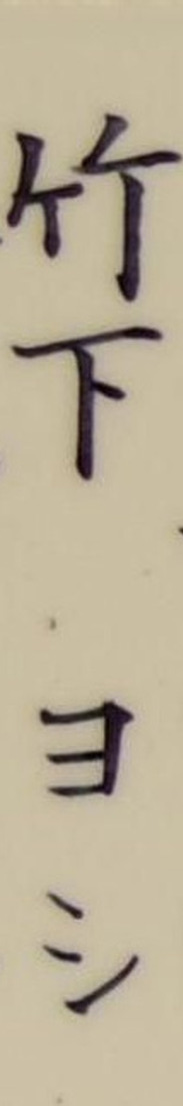竹下ヨシ
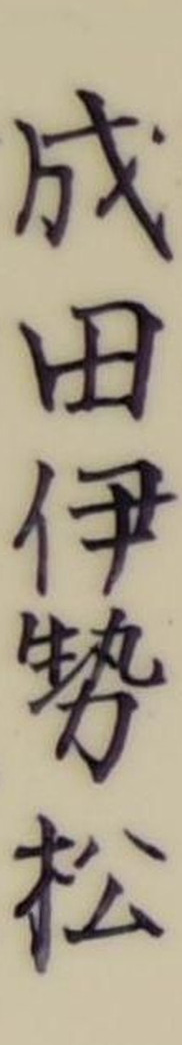成田伊勢松
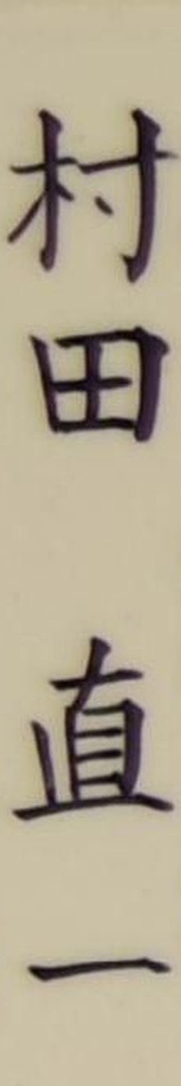村田直一

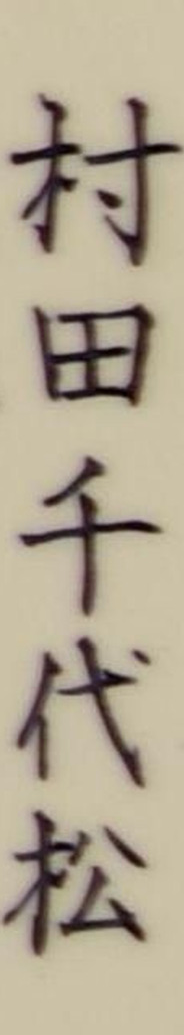村田千代松
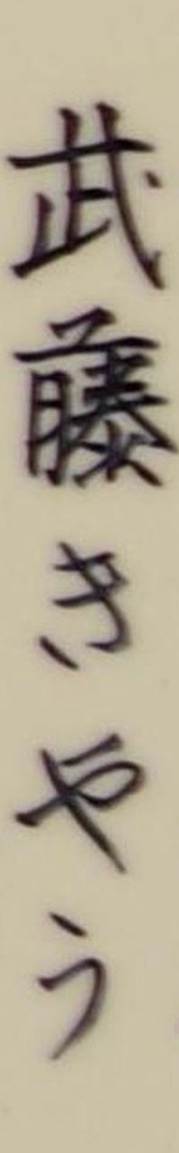武藤きやう
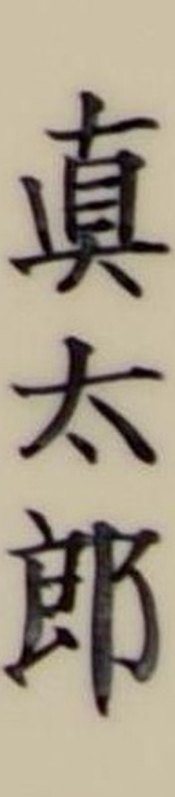直太郎
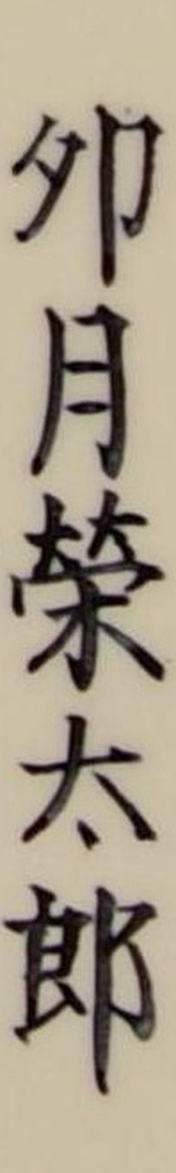卯月栄太郎
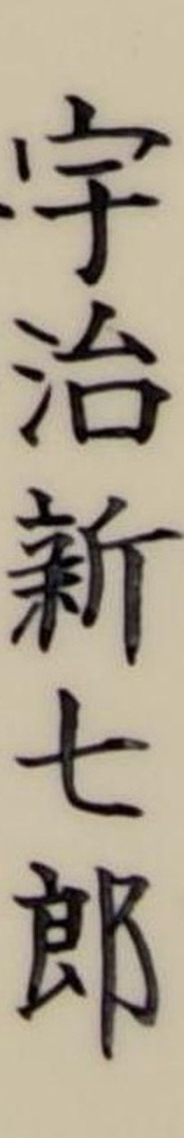宇治新七郎
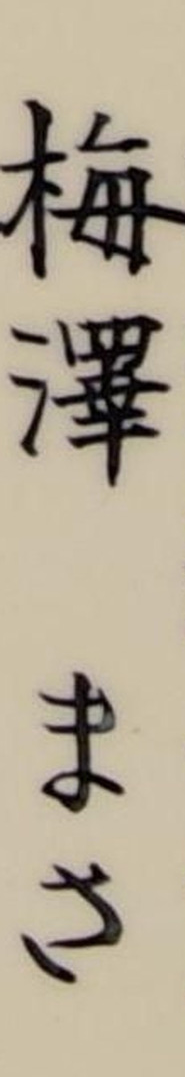梅澤まさ
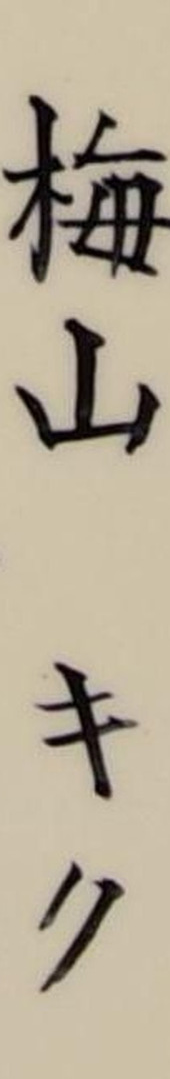梅山キク
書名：A~D
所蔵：koyasan kongobuji
